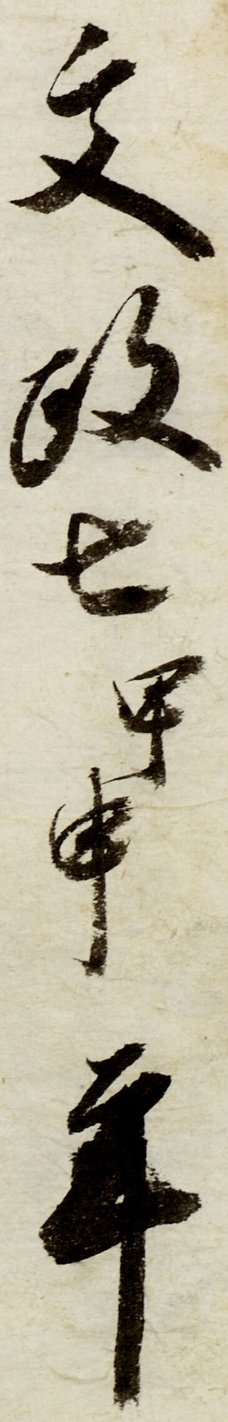文政七甲申年
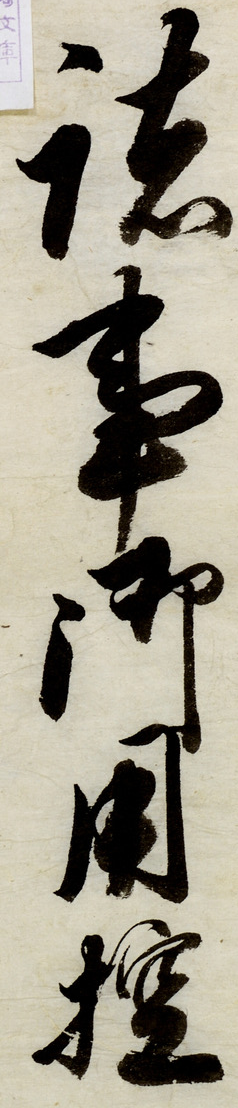諸事御用控
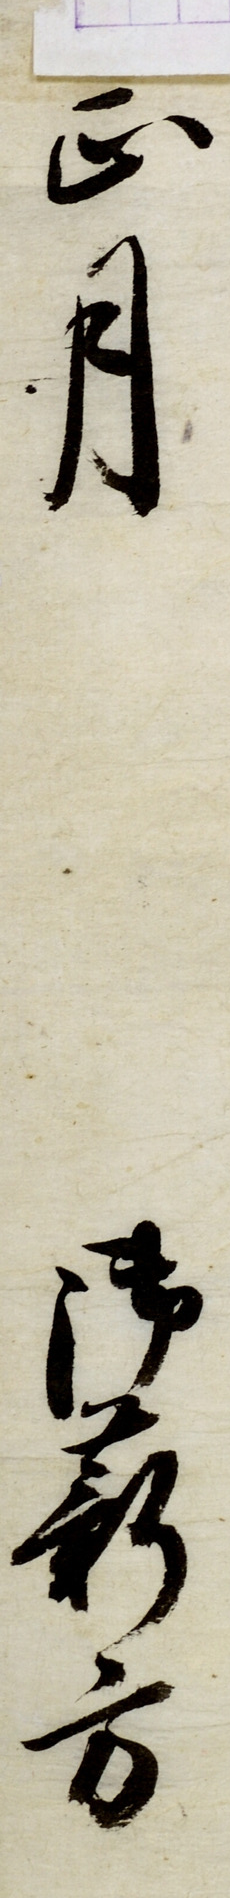正月御薪方
